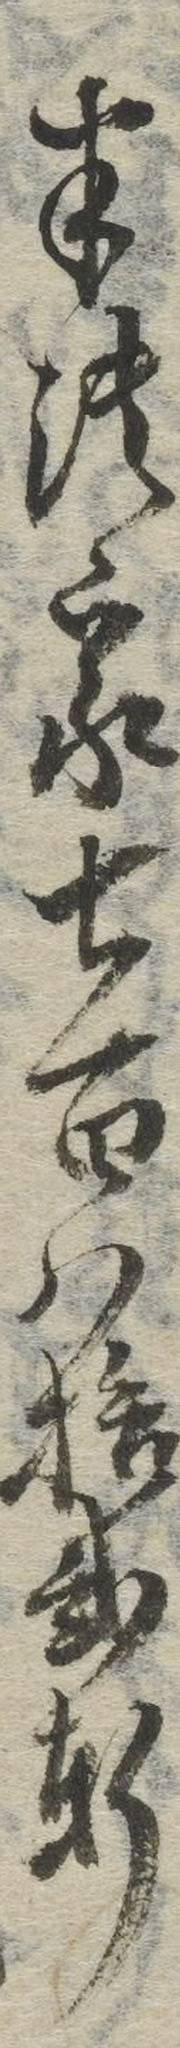半潰家七百八拾弐軒
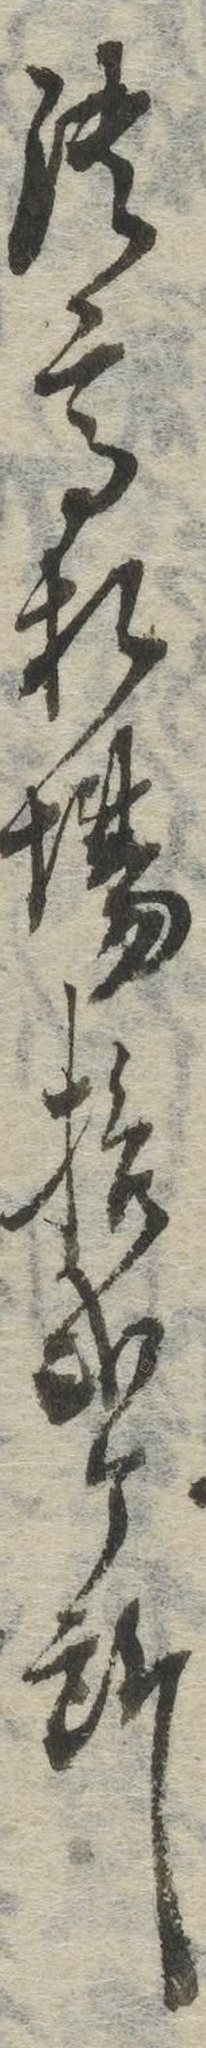潰高札場拾弐ヶ所
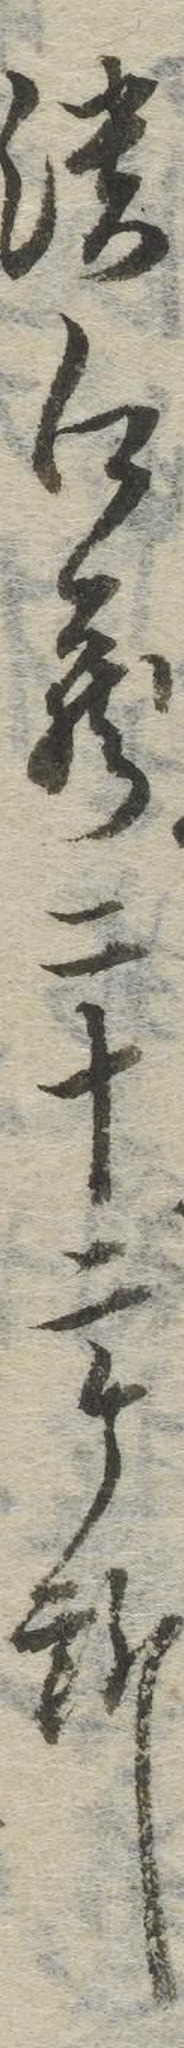潰郷蔵二十二ヶ所
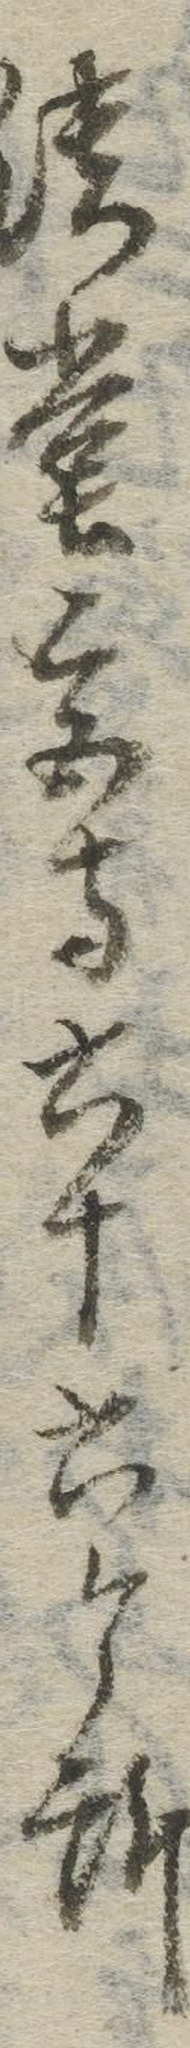潰堂宮寺六十六ヶ所
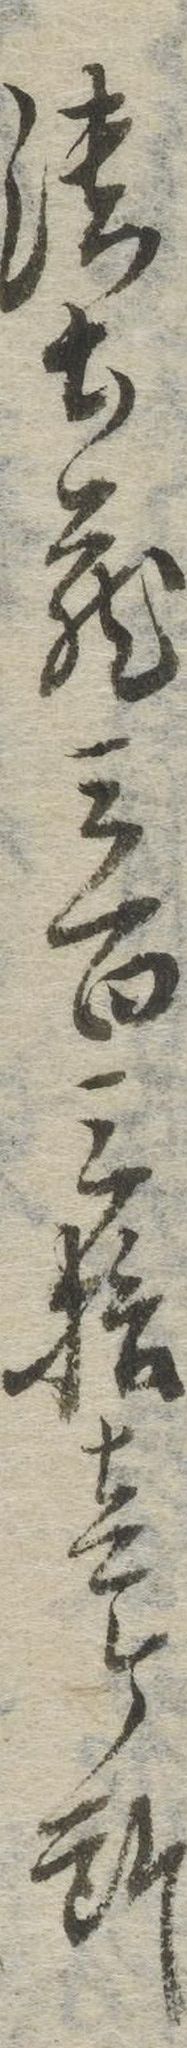潰土蔵三百三拾壱ヶ所
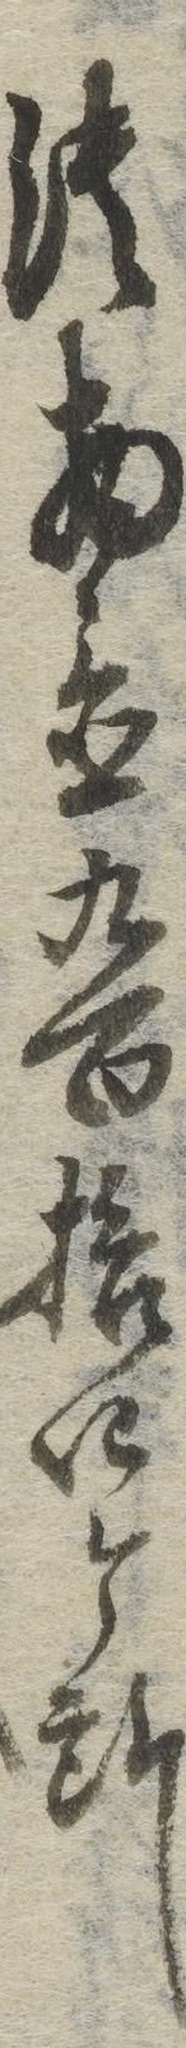潰物置九百拾四ヶ所
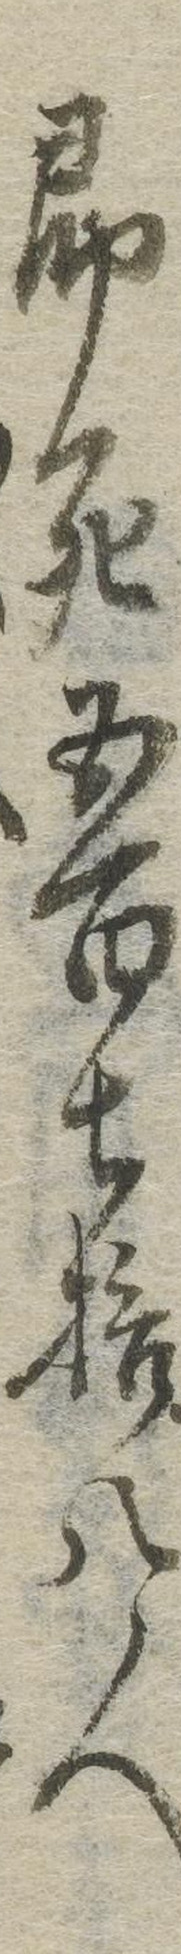即死五百七拾八人
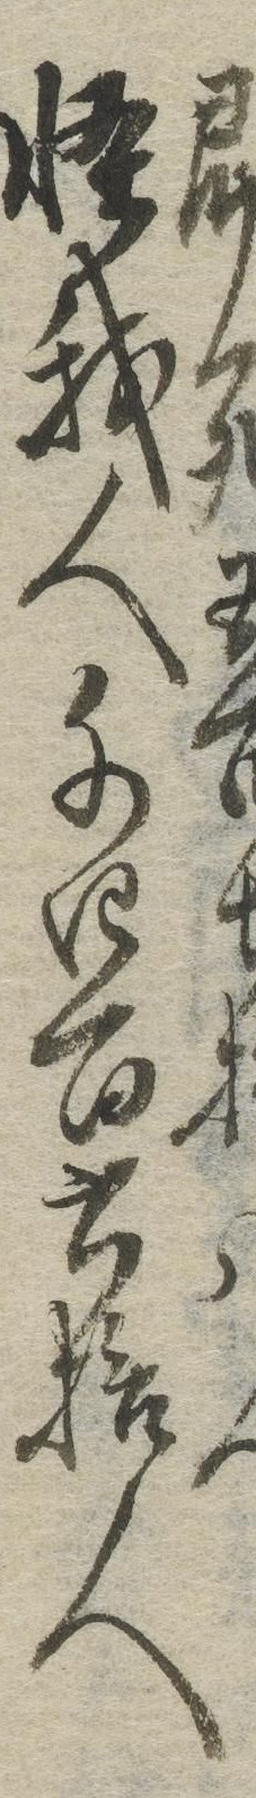怪我人千四百六拾人
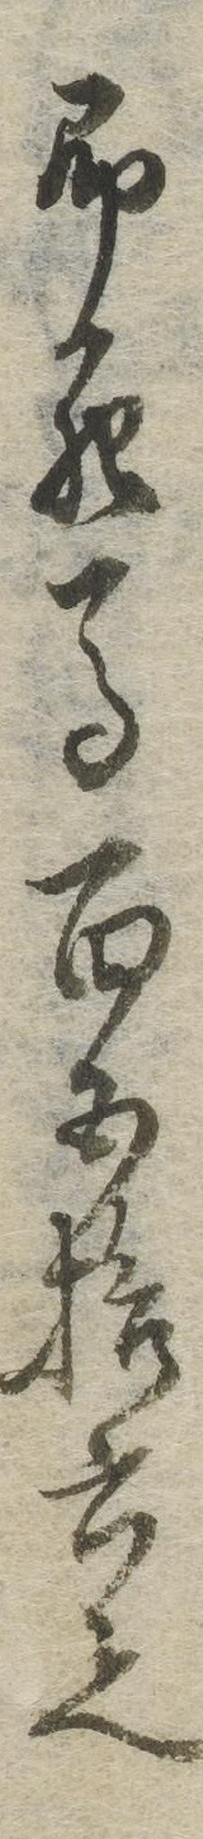即死馬百五拾六疋

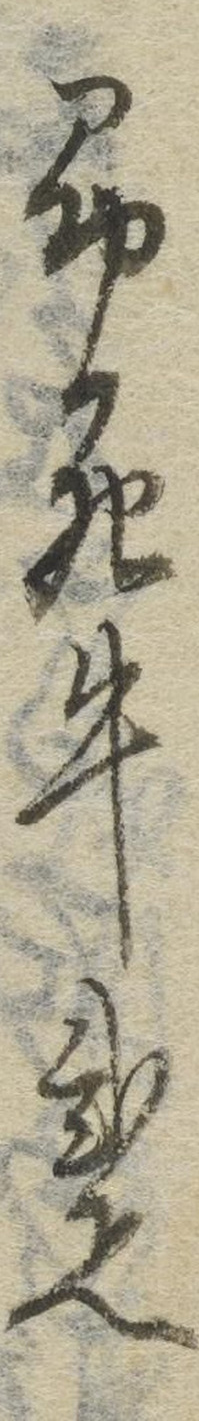即死牛弐疋
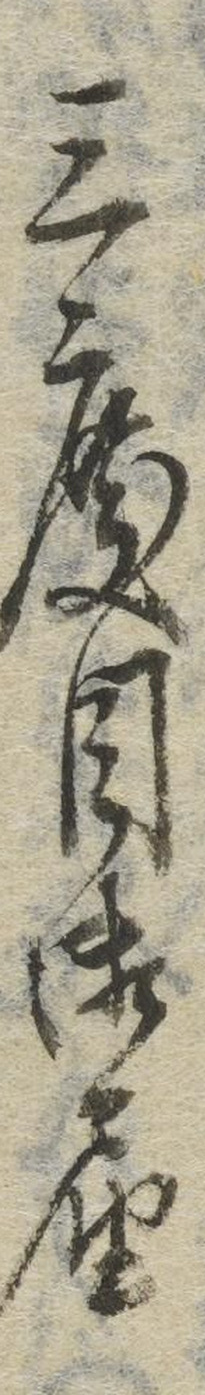三度目御届
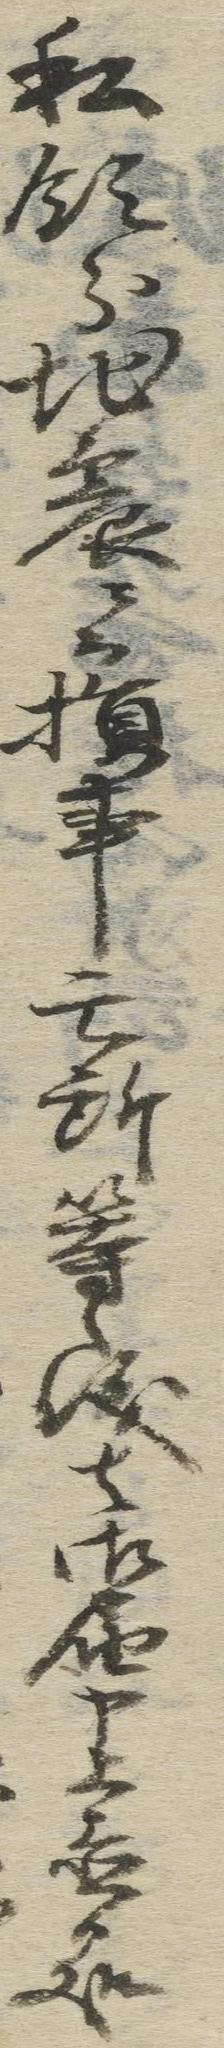私領分地震二而損事亡処等之儀は御届申上置候処
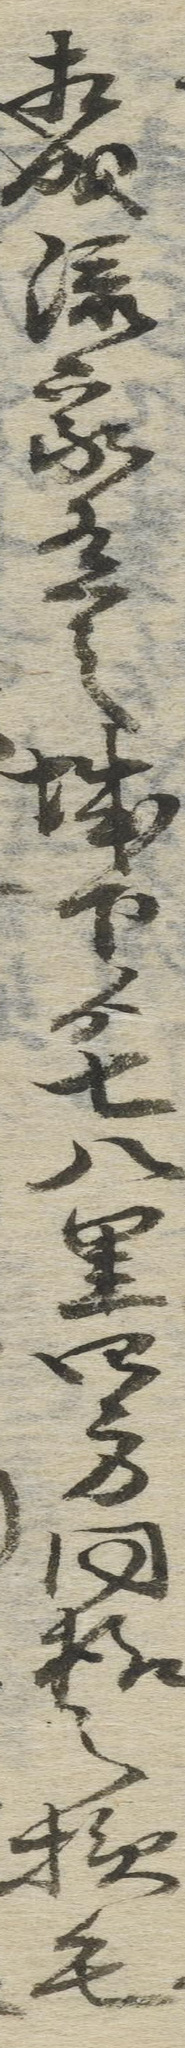相成流家有之城下ゟ七八里四方同様之損毛
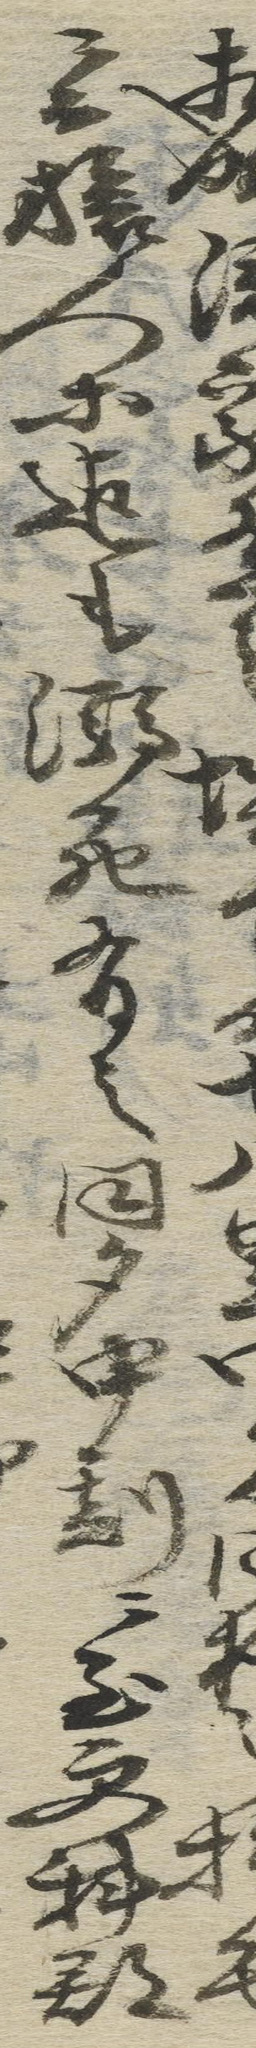旅人等迄も溺死有之同夕申刻二至更級郡
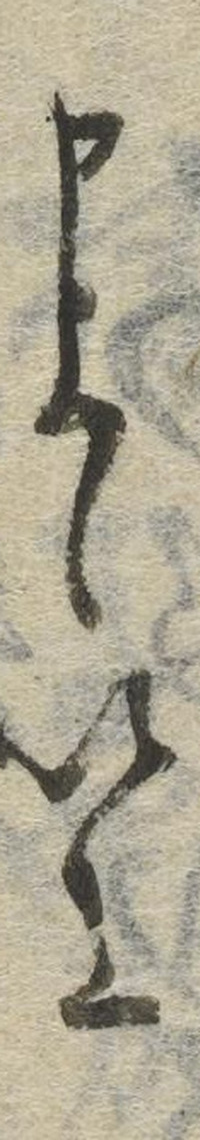申上候以上
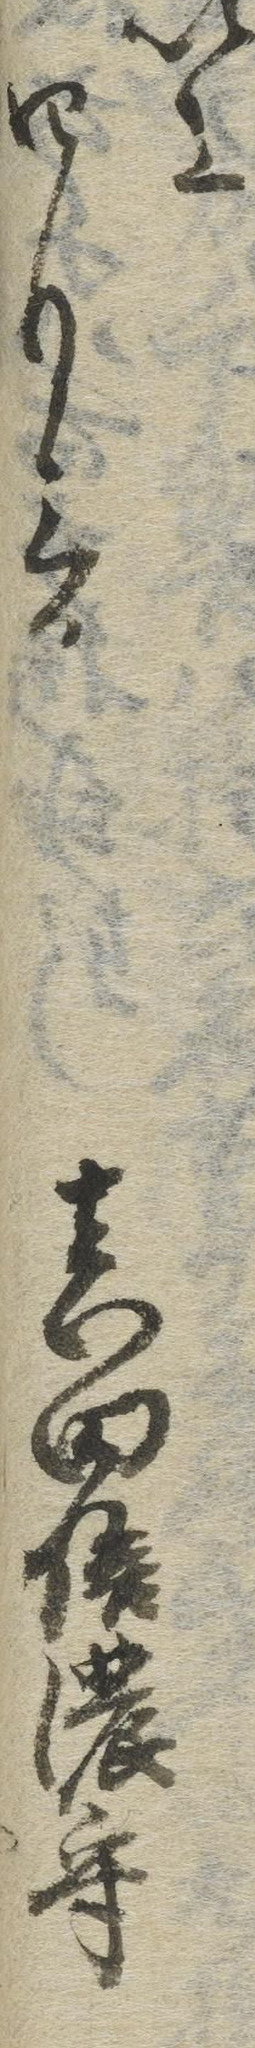四月三日真田信濃守
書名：信濃越後　地震書留
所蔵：東京大学地震研究所図書室 Earthquake Research Institute Library, The University of Tokyo, JAPAN
